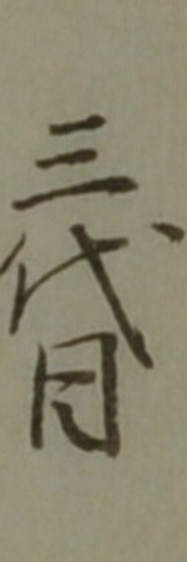三代目
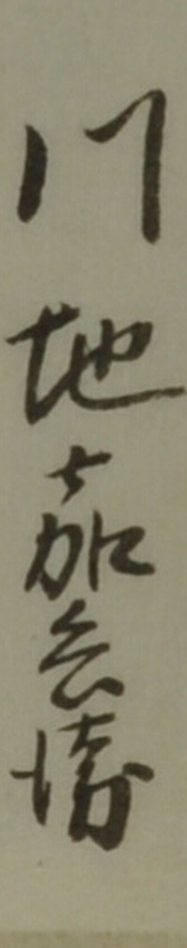川地嘉兵衛
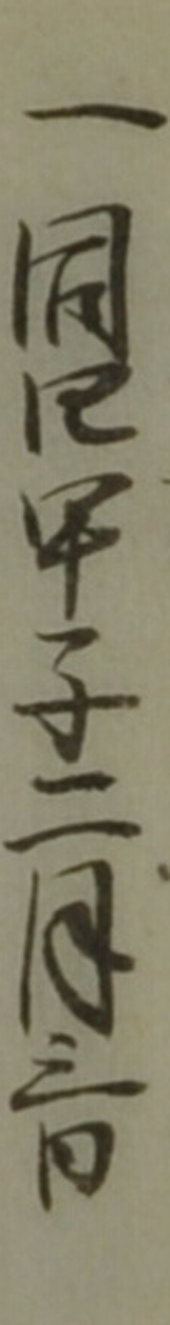一同四甲子二月三日
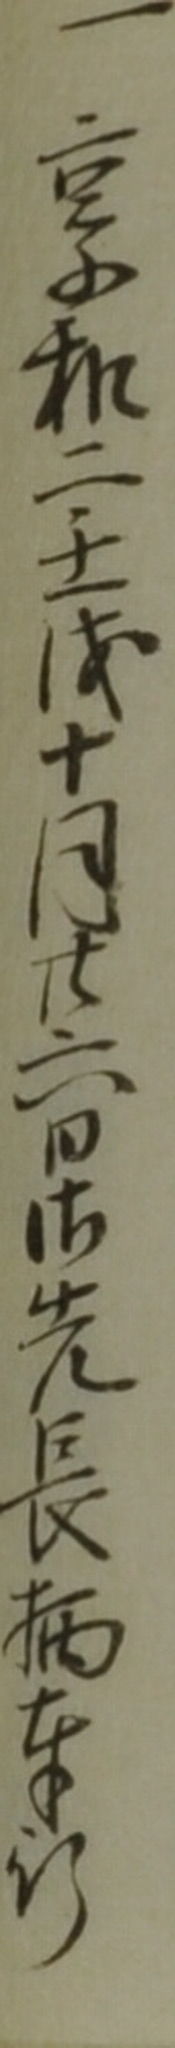一享和二壬戌十月廿六日御先長柄奉行
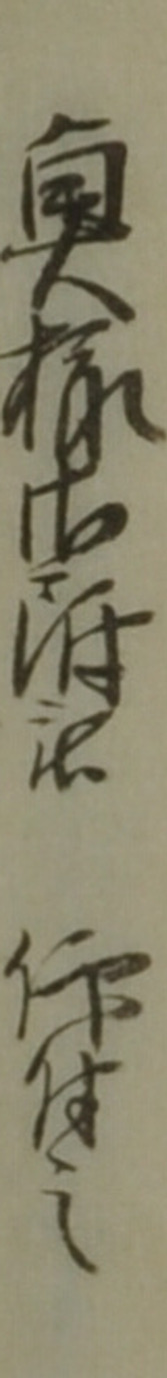奥様御附被仰付之
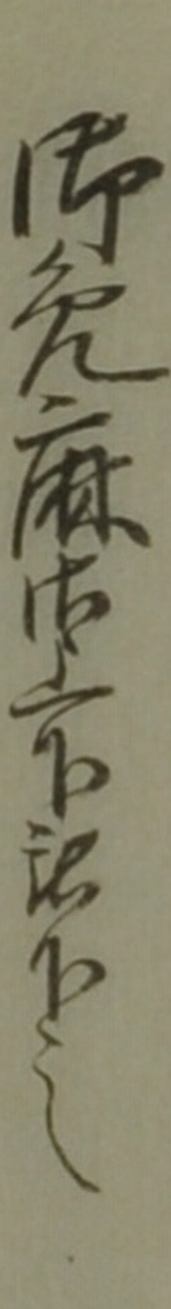御免麻御上下被下之
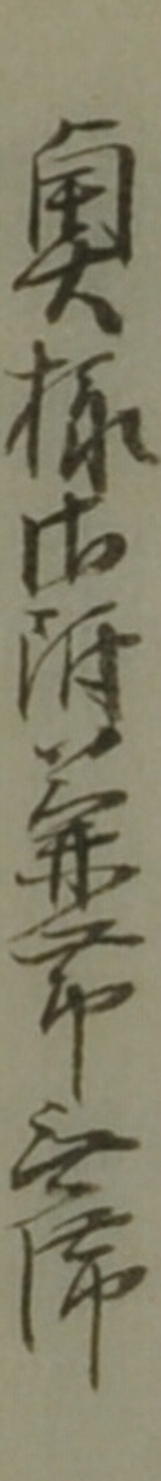奥様御附兼帯無滞
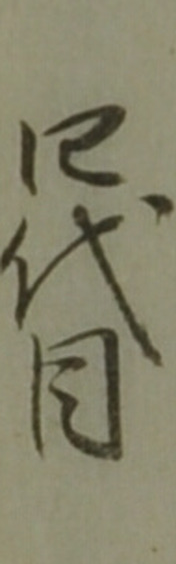四代目
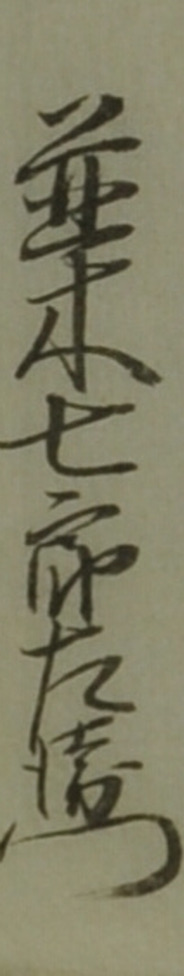並木七郎左衛門
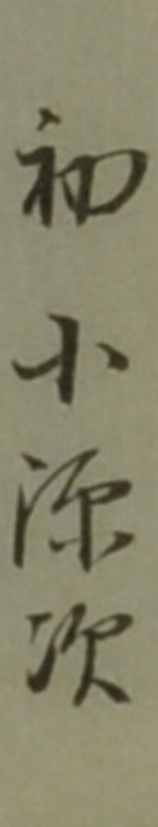初小源次
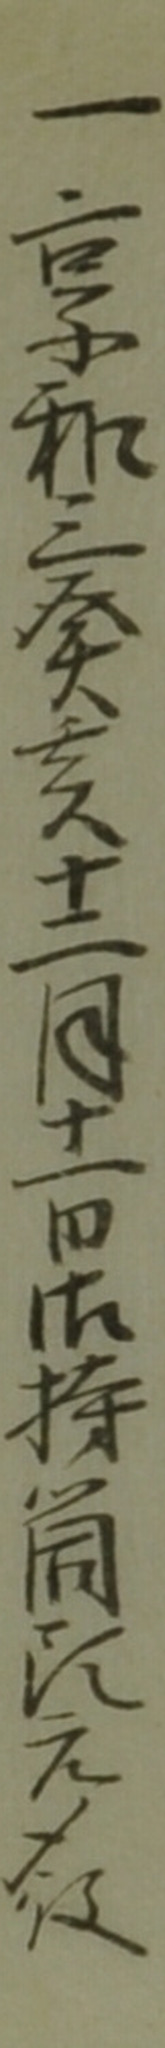一享和三癸亥十二月十一日御持筒頭元〆役
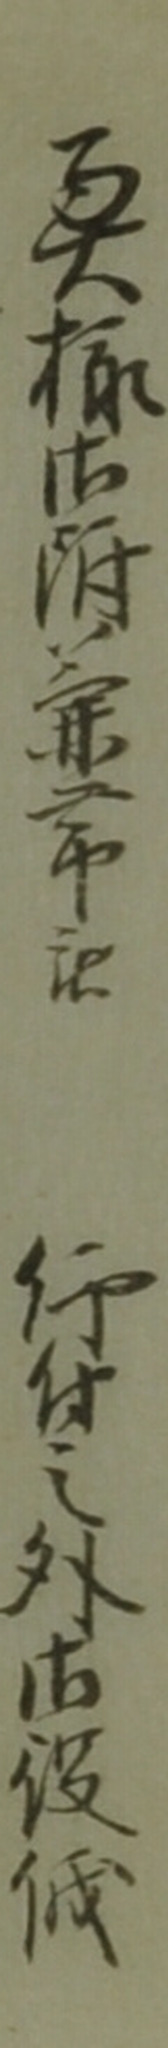奥様御附兼帯被仰付之外御役儀
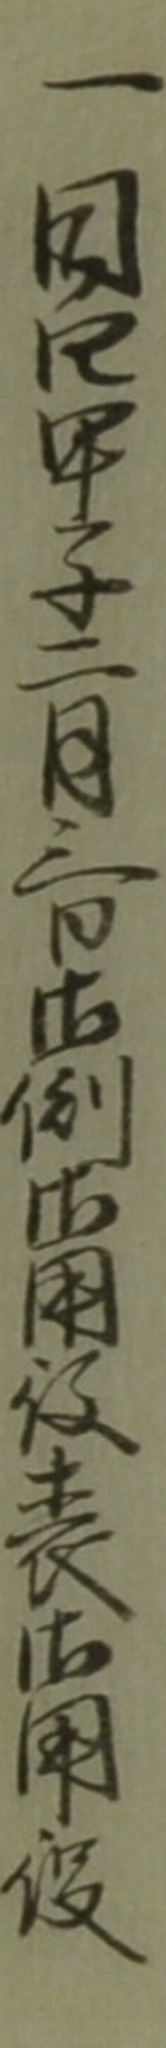一同四甲子二月三日御側御用役表御用役
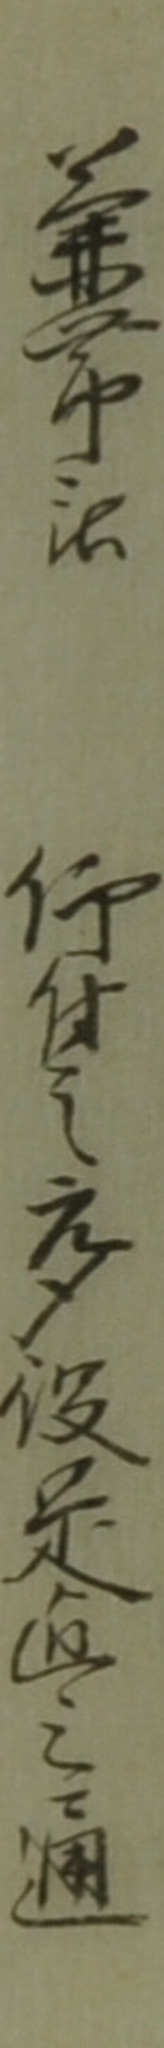兼帯被仰付之元〆役是迄之通
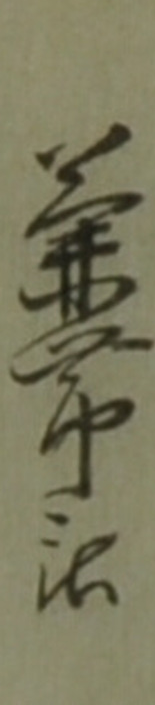兼帯ゟ
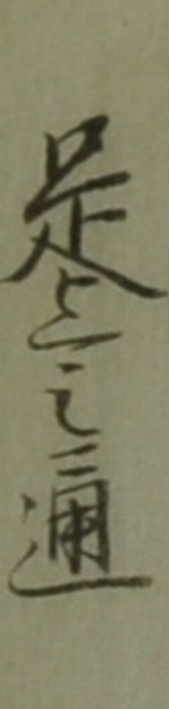是迄之通
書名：諸御役代々録（六）
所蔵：伊那市立高遠町図書館・合同会社AMANE
